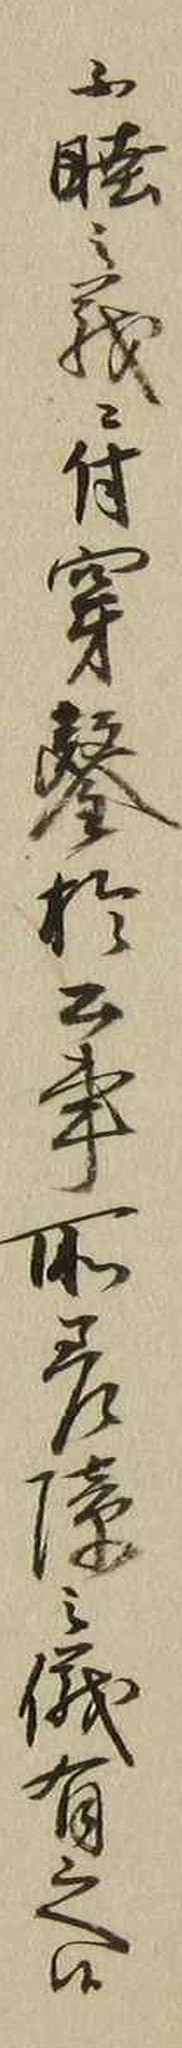不睦之義ニ付穿鑿於公事所差障之儀有之候
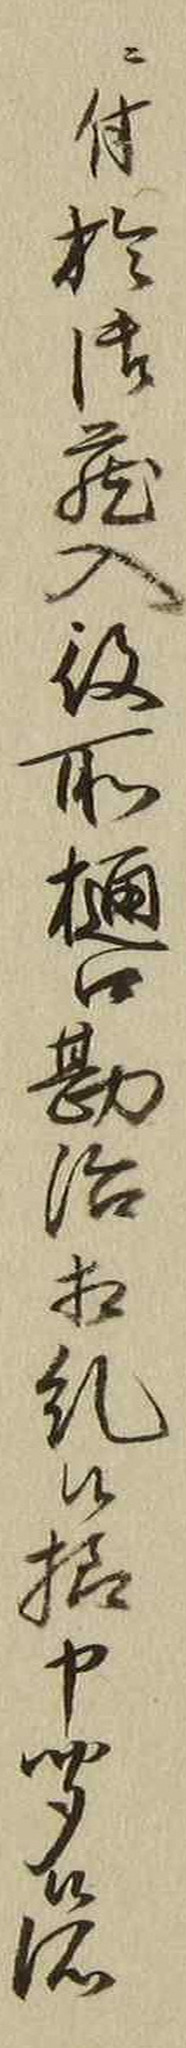ニ付於御蔵入役所樋口勘治相糺候様申聞候所
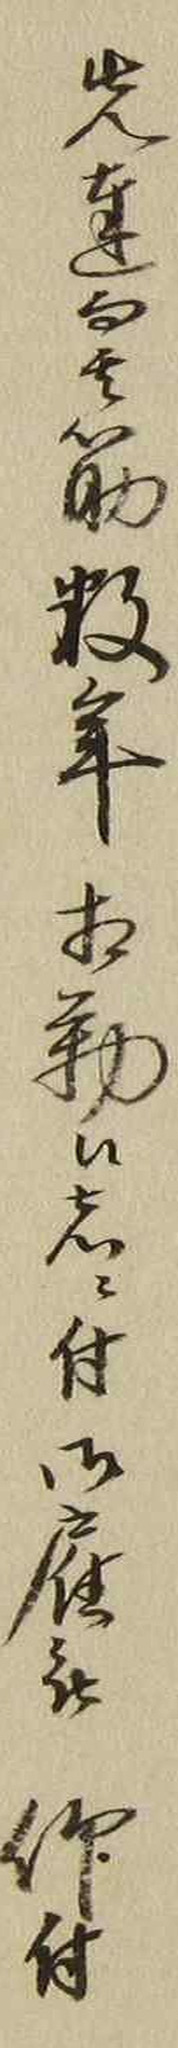先達而其筋数年相勤候者ニ付御雇被仰付
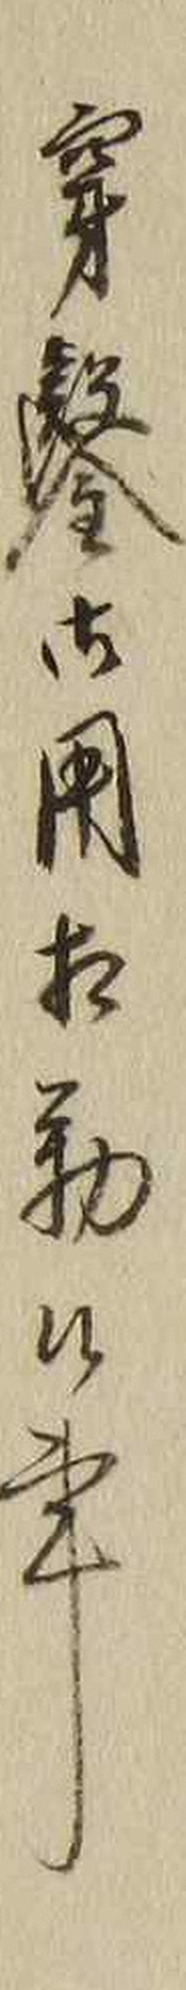穿鑿御用相勤候事
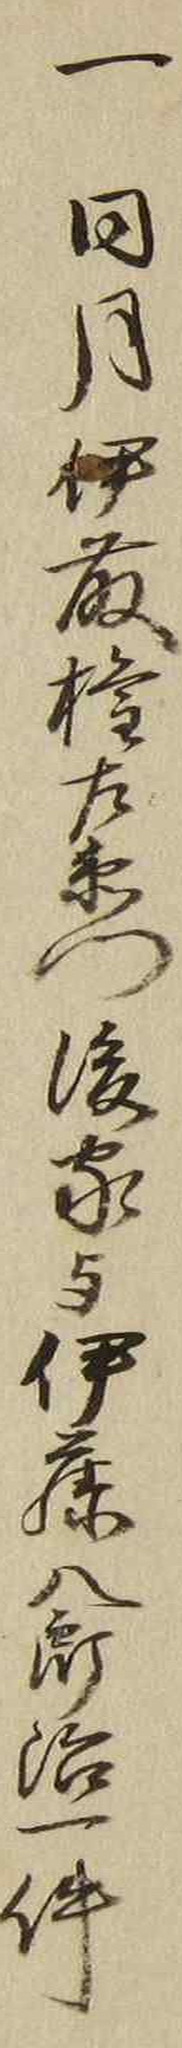一同月伊藤権左衛門後家与伊藤八郎治一件
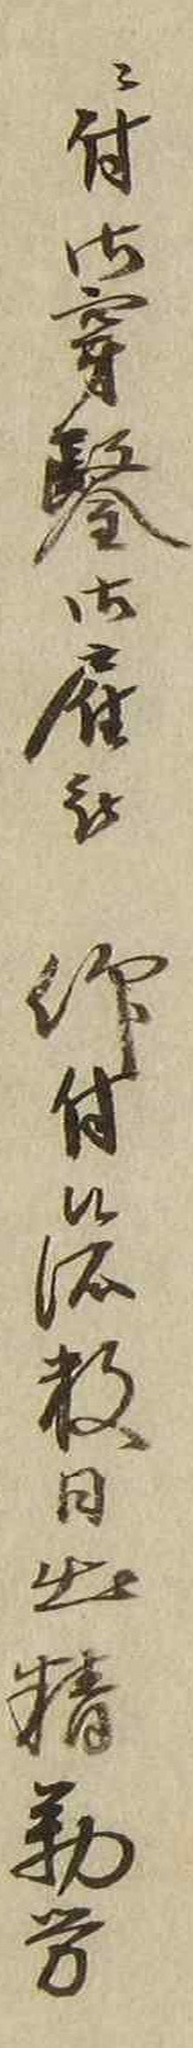ニ付御穿鑿御雇被仰付候所数日出精勤労

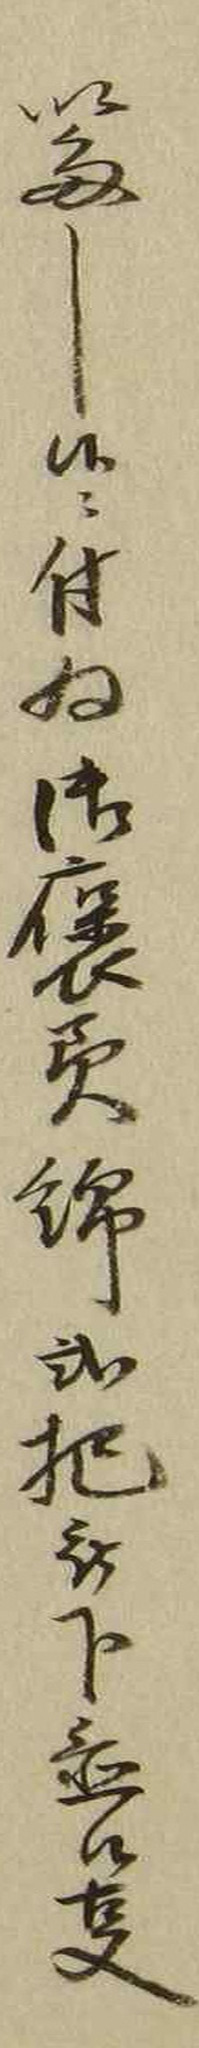いたし候ニ付為御褒美綿弐把被下置候事
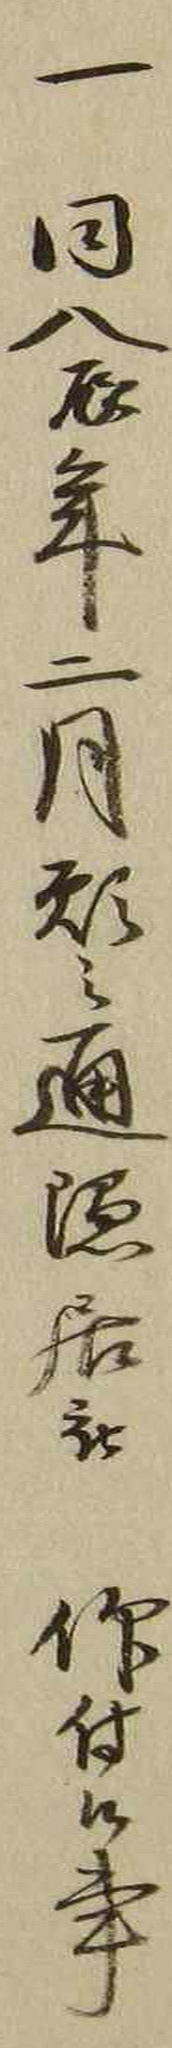一同八辰年二月願之通隠居被仰付候事
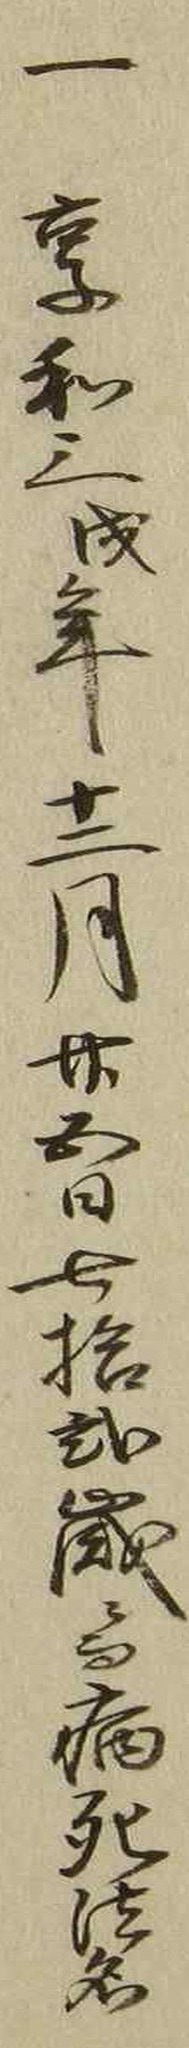一享和三戌年十二月廿五日七拾弐歳ニ而病死法名
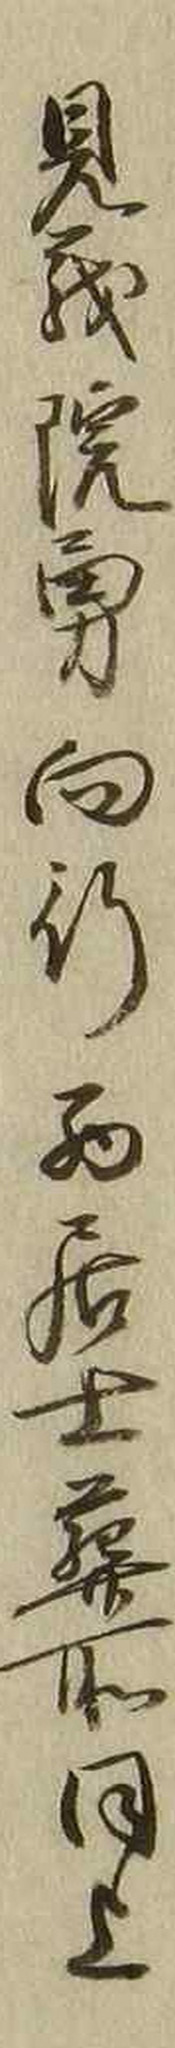見義院勇向行西居士葬所同上
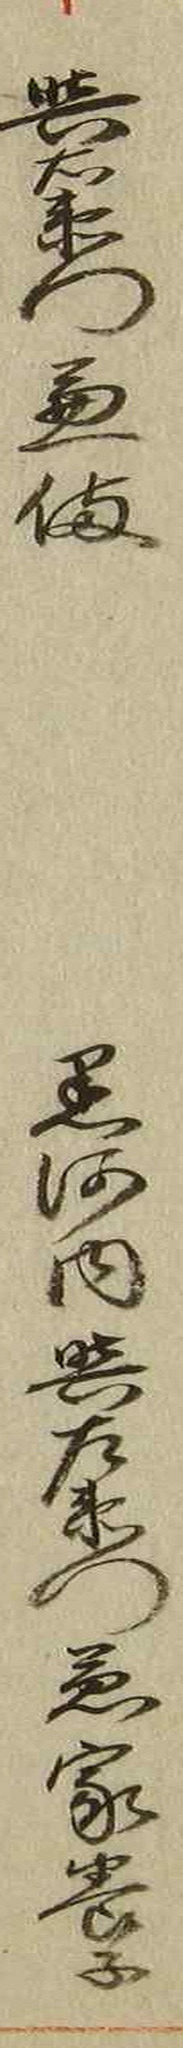与右衛門兼備黒河内与左衛門兼家養子
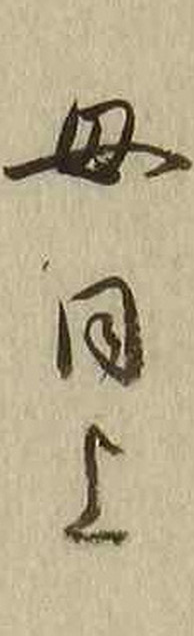母同上
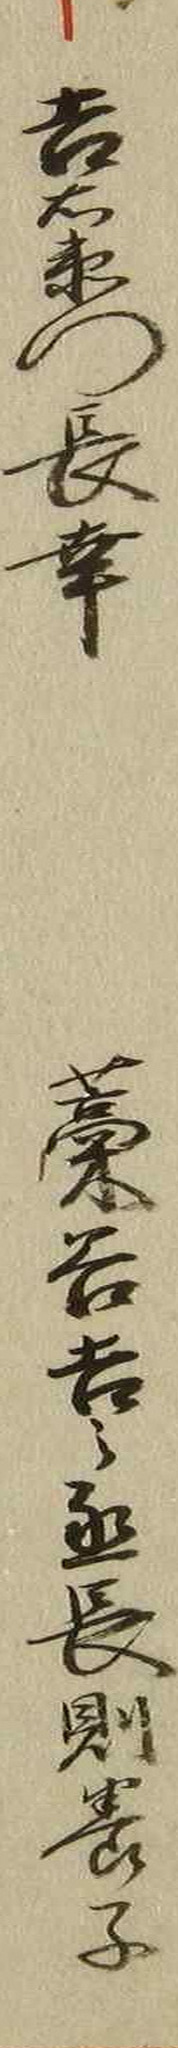吉右衛門長幸藁谷吉之丞長則養子
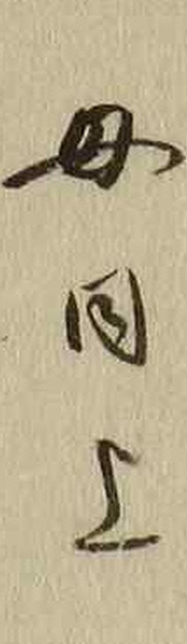母同上
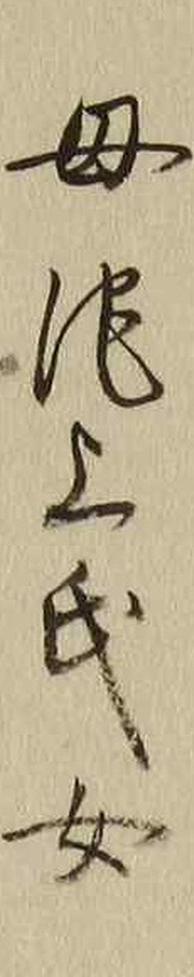母池上氏女
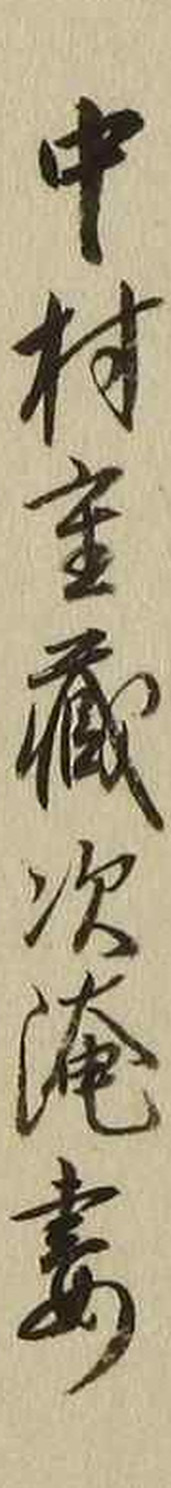女中村重蔵次淹妻
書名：諸士系譜　巻之128　た之部4
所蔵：会津若松市立会津図書館
